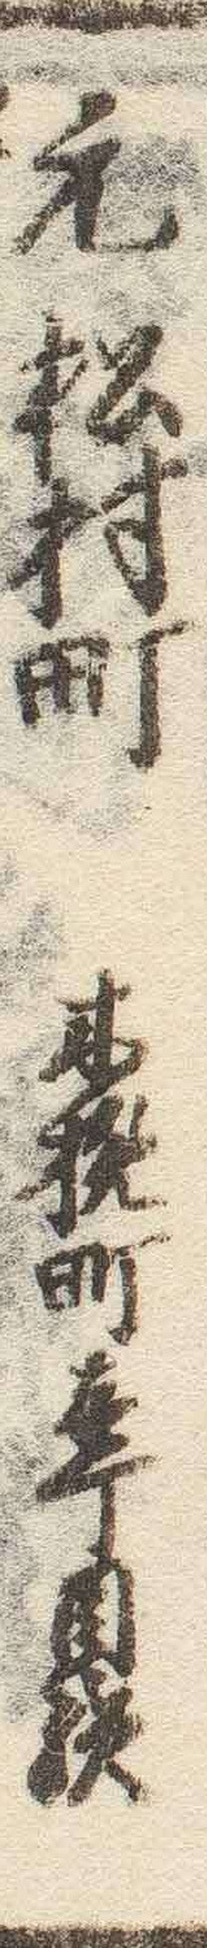元松村町木挽町壱丁目続
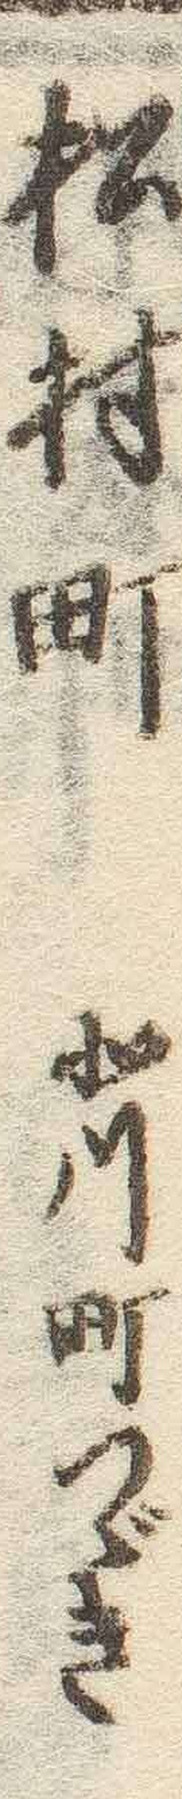松村町北川町つゞき
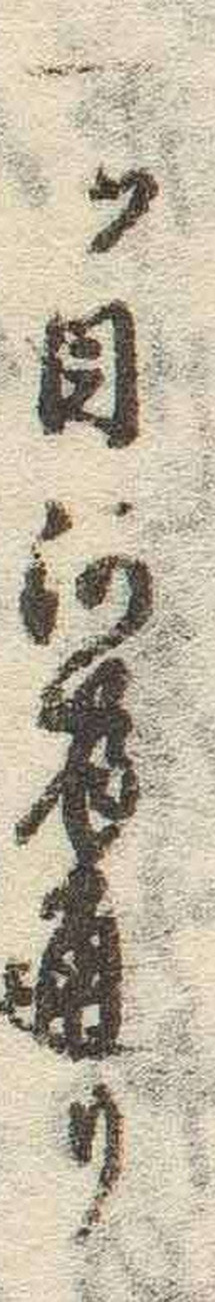一ッ目河岸通り
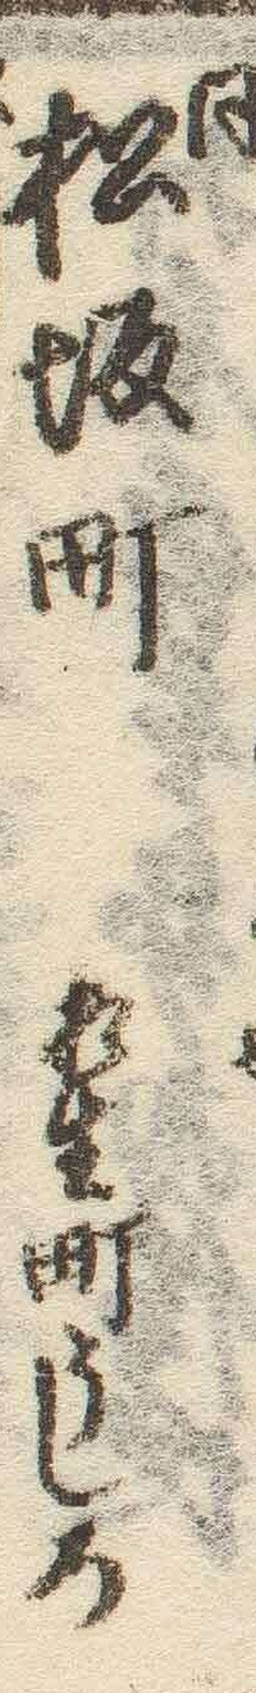松坂町相生町うしろ
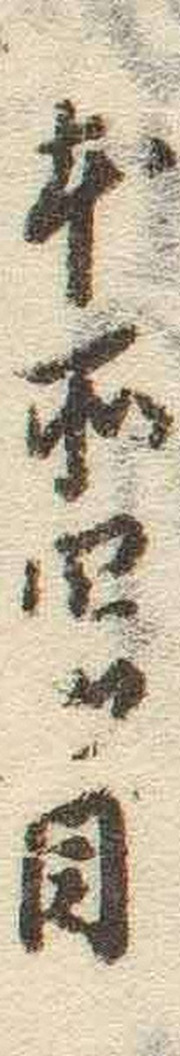本所四ッ目
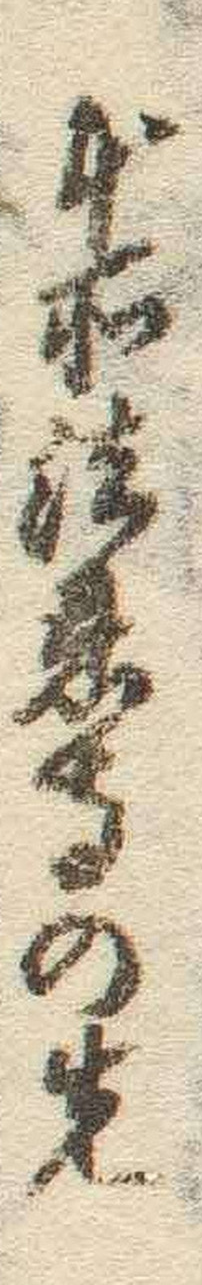本所法恩寺の先
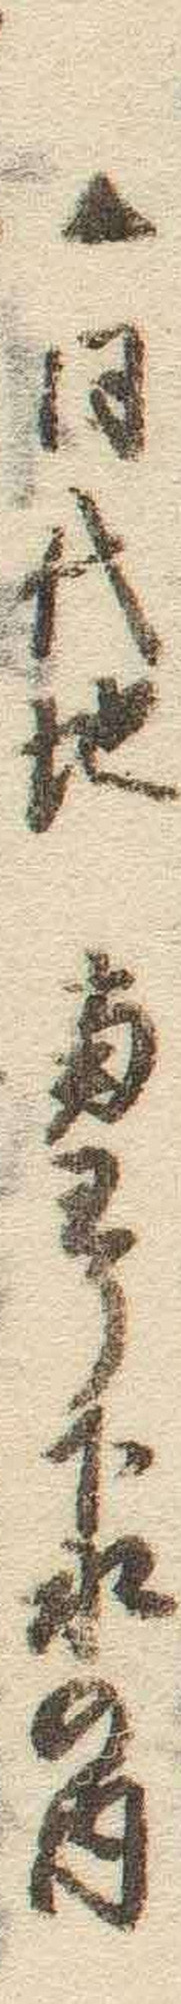▲同代地南わり下水の内

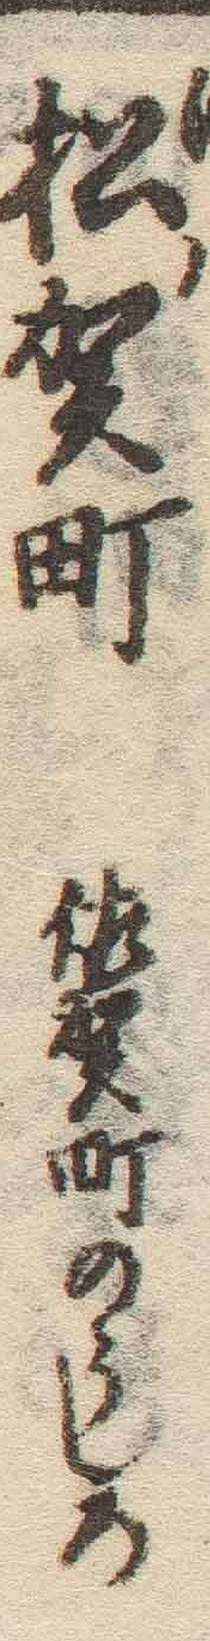松賀町佐賀町のうしろ
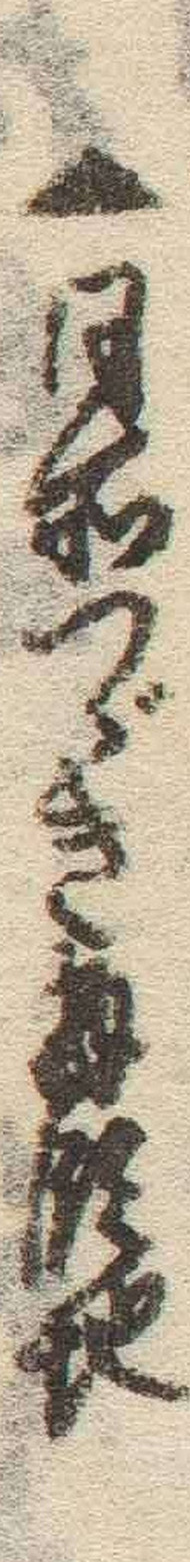▲同所つゞき拝領地
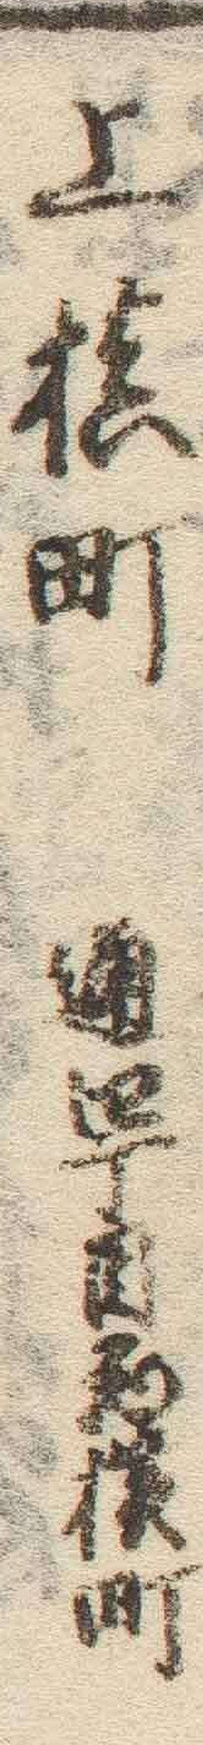上槇町通四丁目西横町
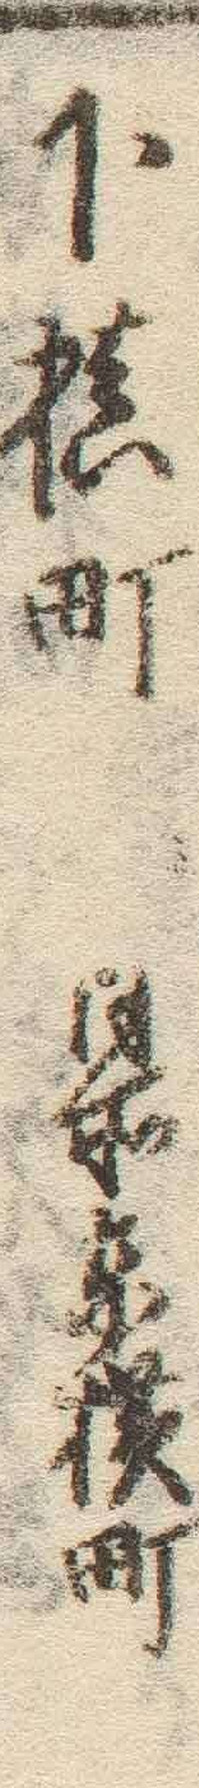下槇町同所東横町
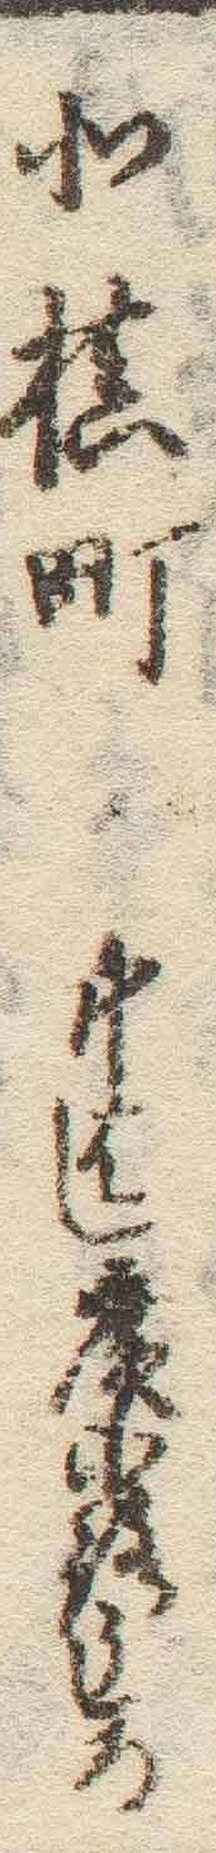北槇町中はし広小路うしろ
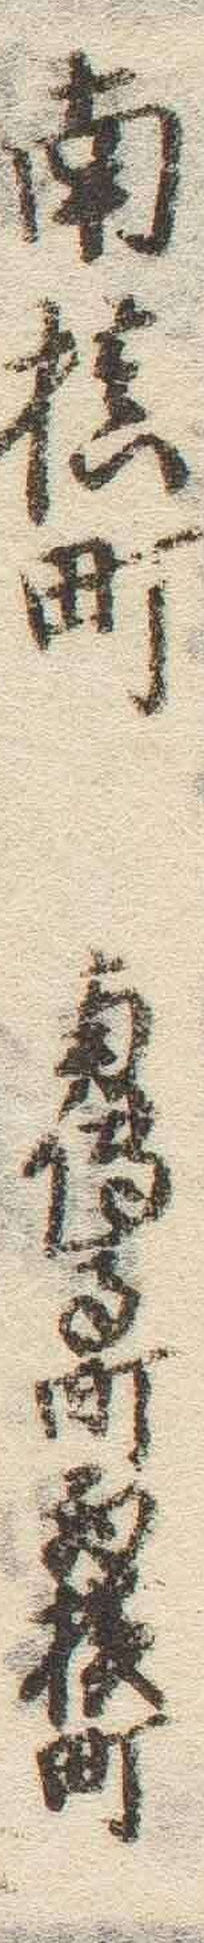南槇町南伝馬町西横町
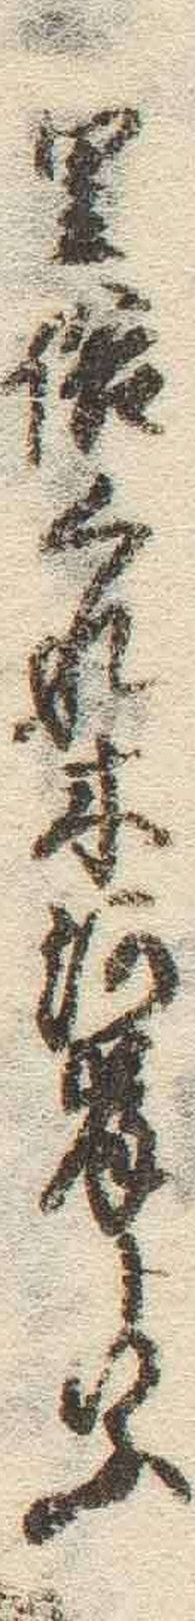里俗くれ木河岸トいふ
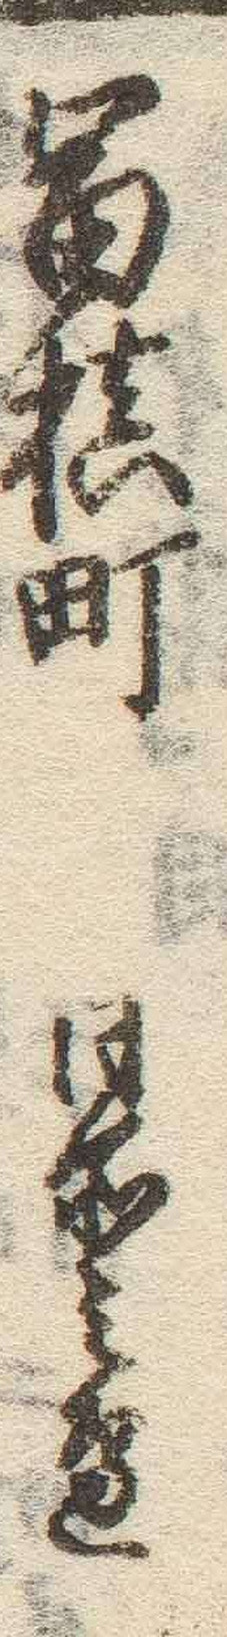富槇町同所之辺
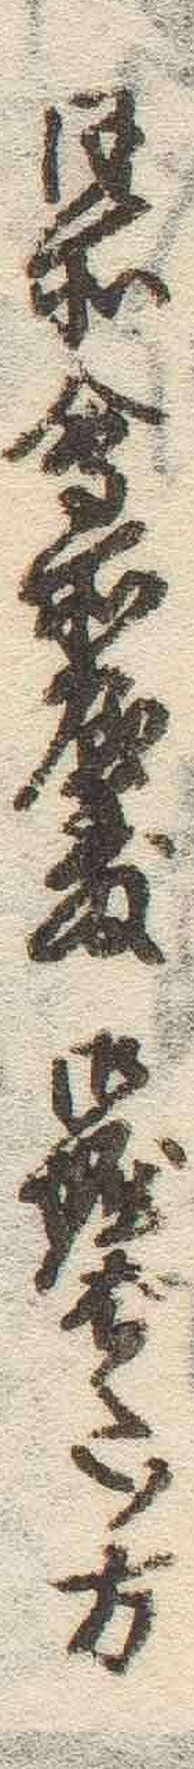同所会所屋敷御掘ばたノ方
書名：江戸町独案内
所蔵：東京学芸大学附属図書館 国文学研究資料館
